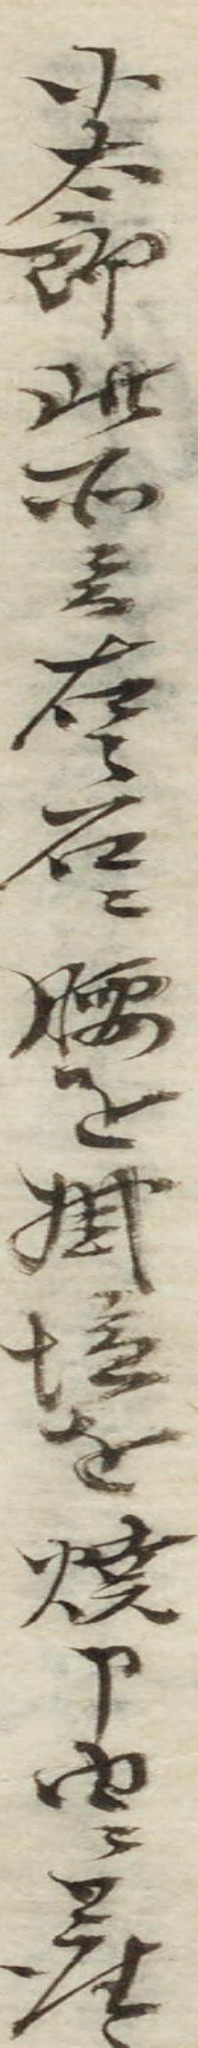小太郎此所に而右之石に腰を掛塩を焼申由に御座候
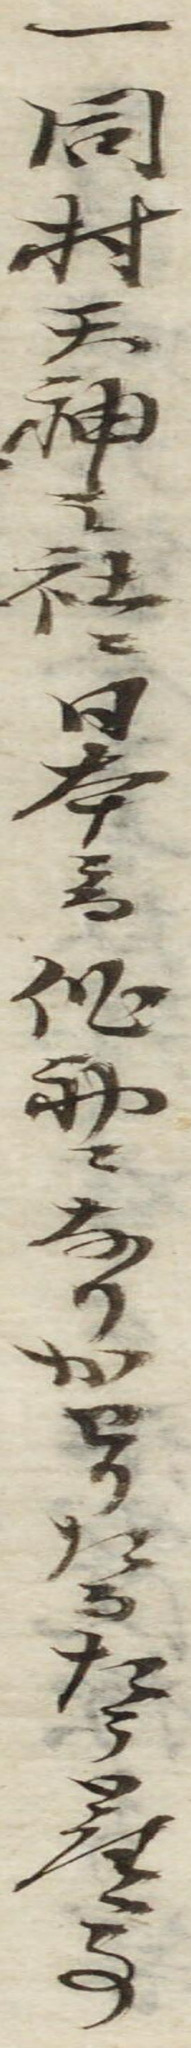一同村天神之社に日本に而作初になりかわりたるたう御座候
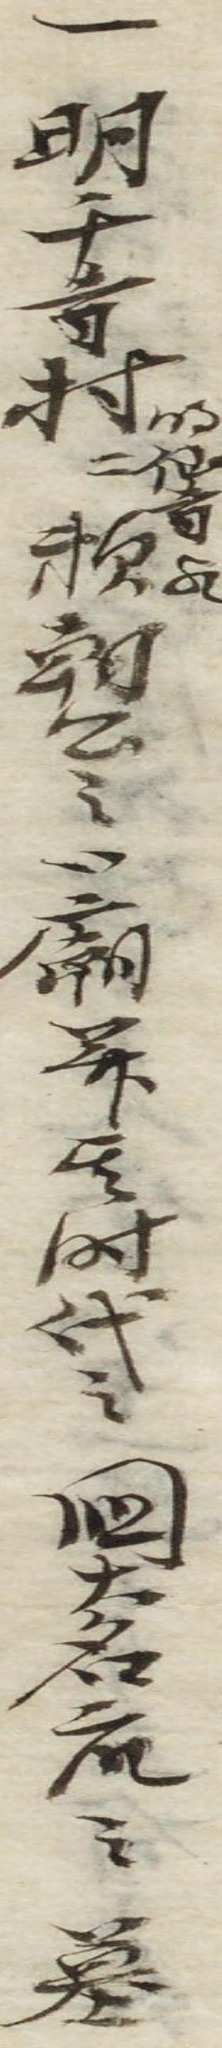一明千寺村に頼朝公之御廟并其時代之国大名衆之墓
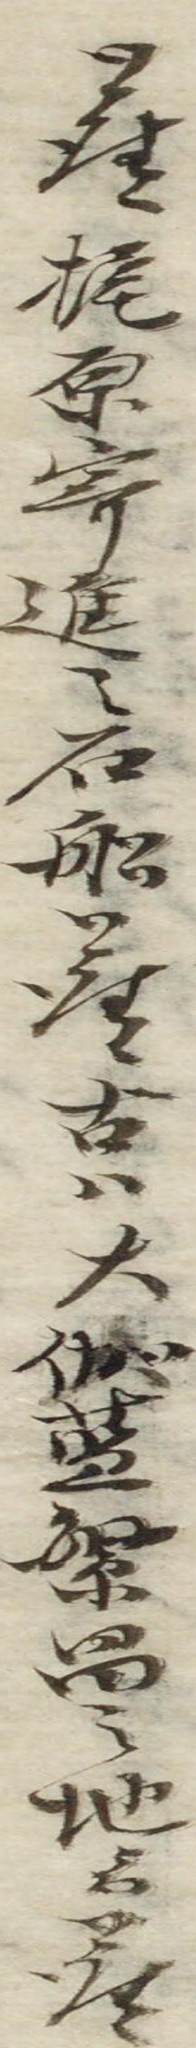御座候梶原寄進之石船御座候古は大伽藍繁昌之地に而御座候
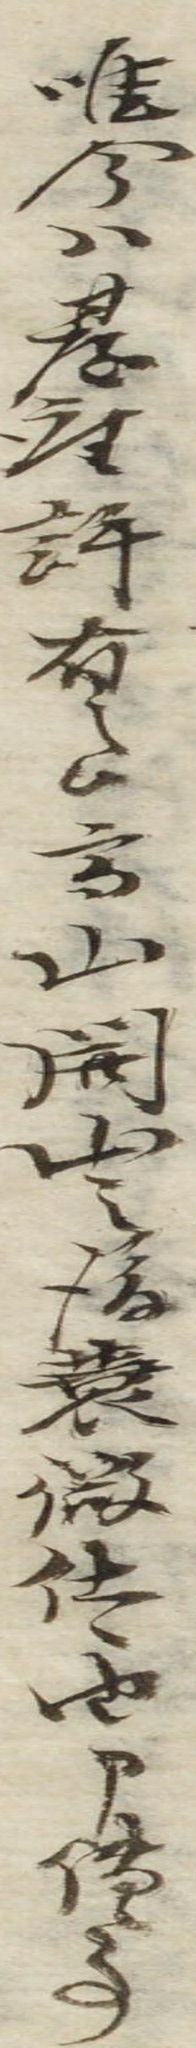唯今は台座許有之候高山開山之後衰微仕候由申伝候事
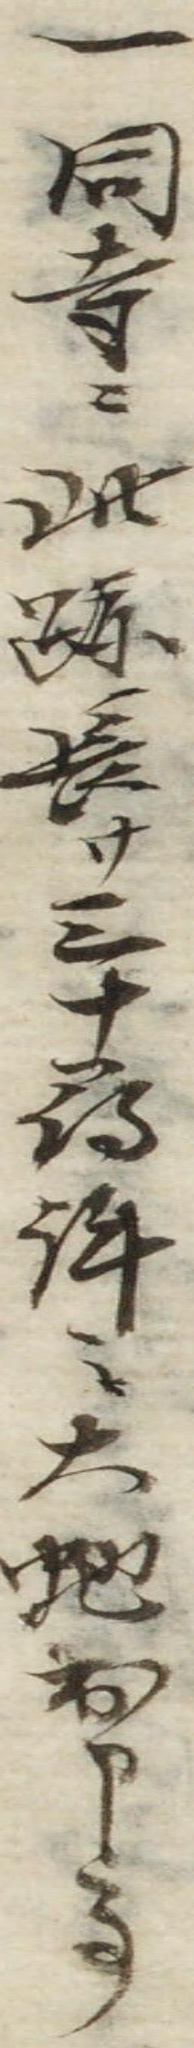一同寺に此跡長さ三十尋許之大蛇出申候事
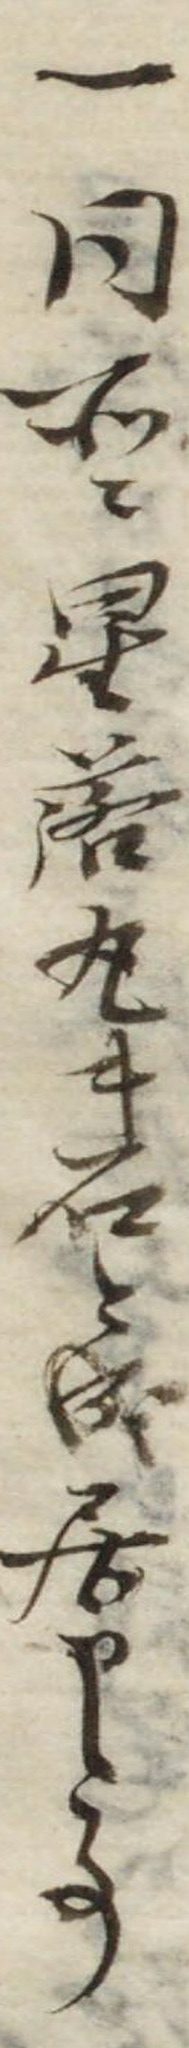一同所に星落丸き石と成居申候事
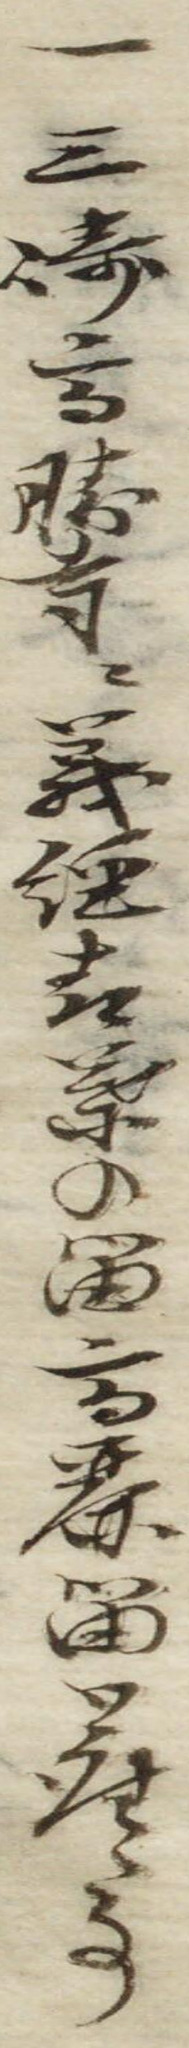一三崎高高勝寺に義経表葉の笛高麗笛御座候事
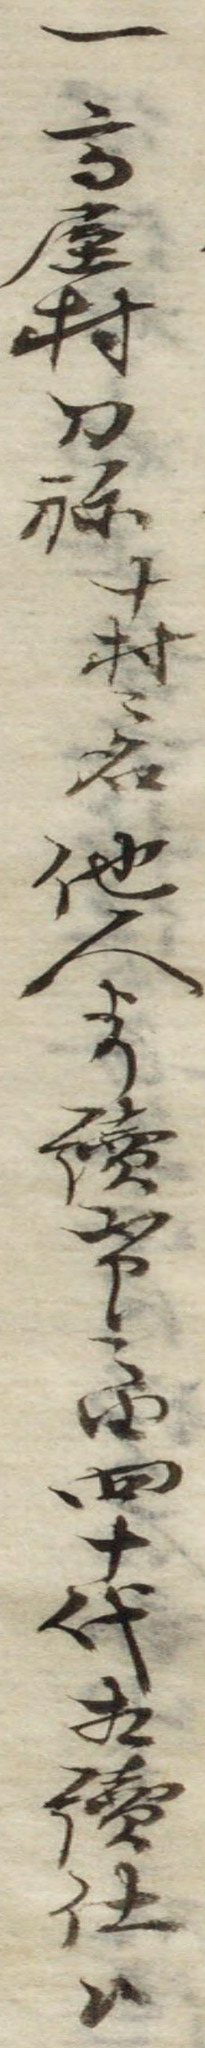一高屋村刀祢十村に名他人より続不申之由四十代相続仕候

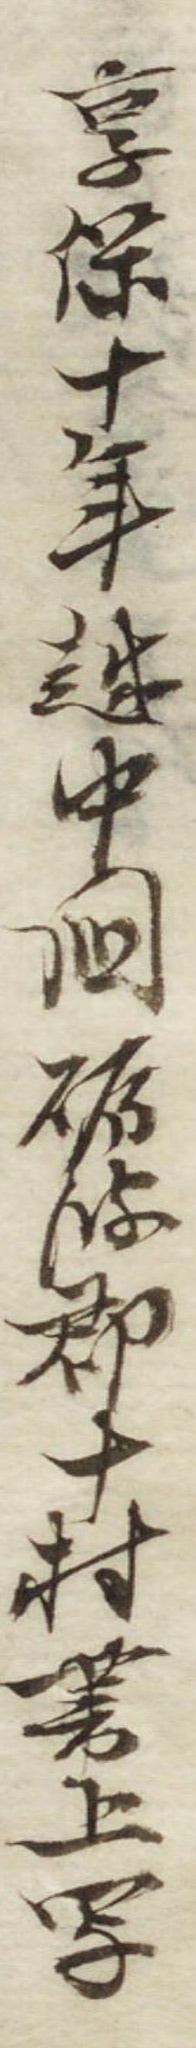享保十年越中国砺波郡十村書上写
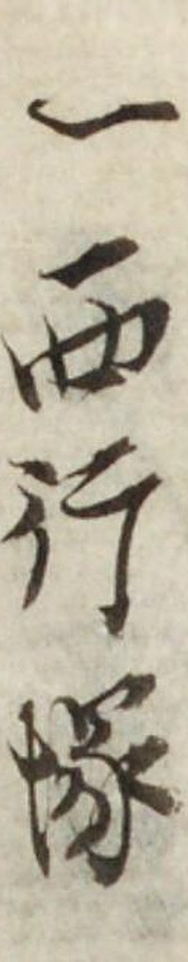一西行塚
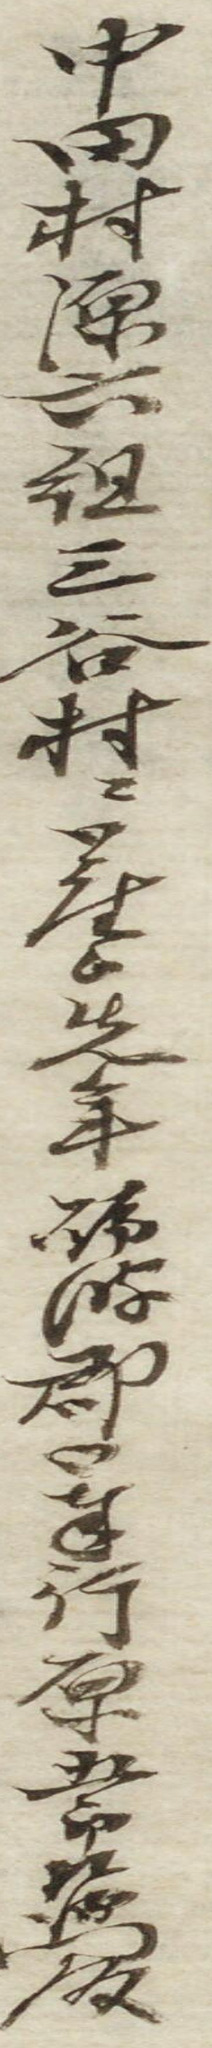中田村源六組三谷村に御座候先年砺波郡御奉行原五郎左衛門殿
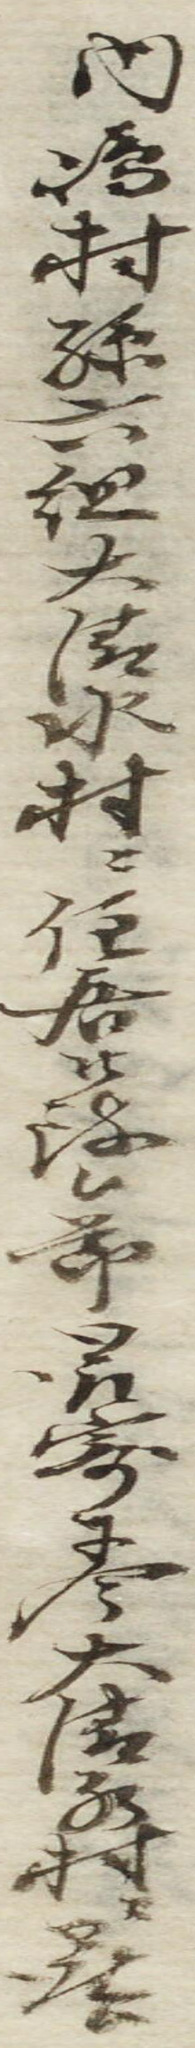内嶋村孫六組大清水村に住居被致候節御取寄于今大清水村に御座候
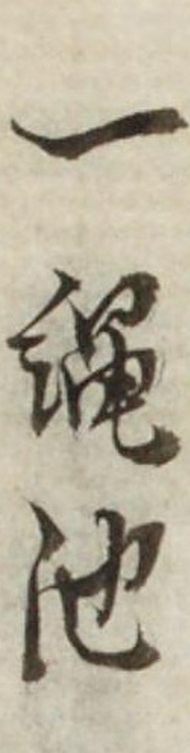一縄池
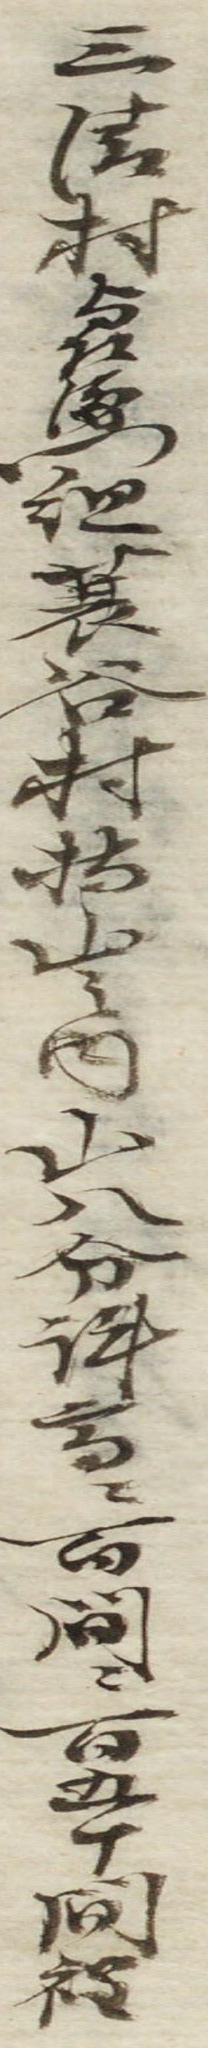三清村与左衛門組蓑谷村持山之内山八許高に百間に百五十間程
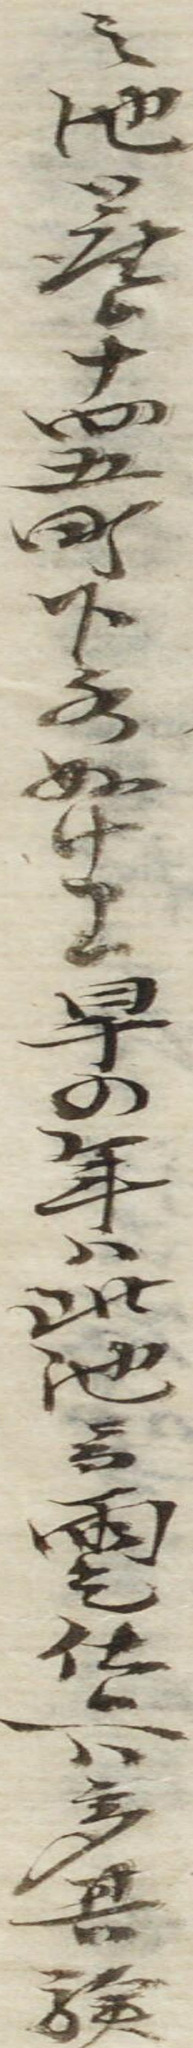之池御座候十四五町下水ぬけ申候旱の年は此池に而雨乞仕候へは多其験
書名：加越能旧聞録
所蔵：Ishikawa Prefectural Library
